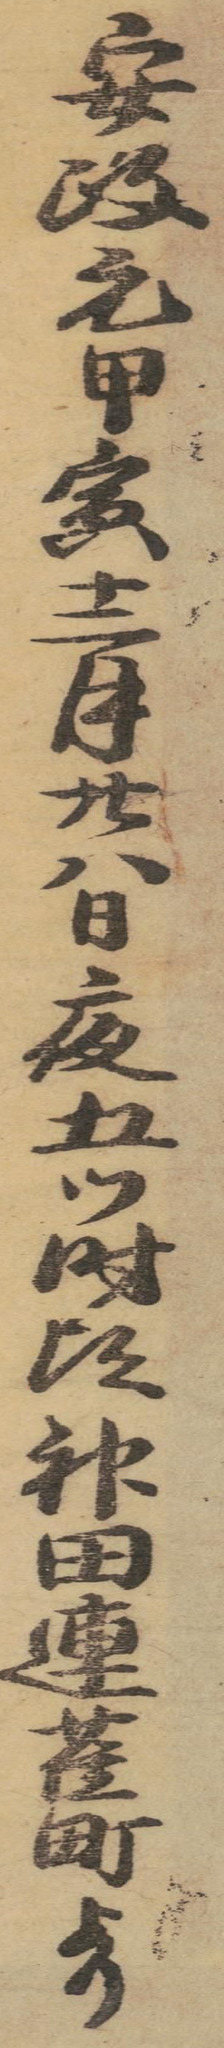安政元甲寅十二月廿八日夜五ツ時頃神田連雀町より
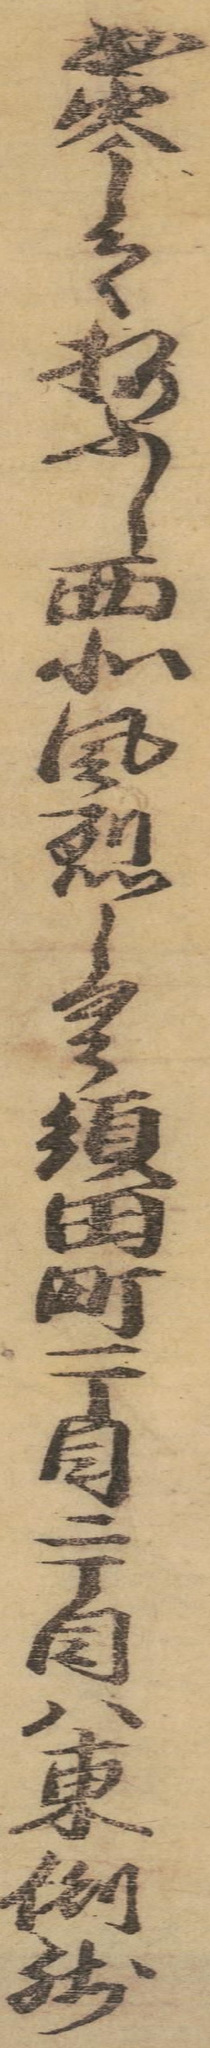出火して折ふし西北風烈しく須田町一丁目二丁目ハ東側残
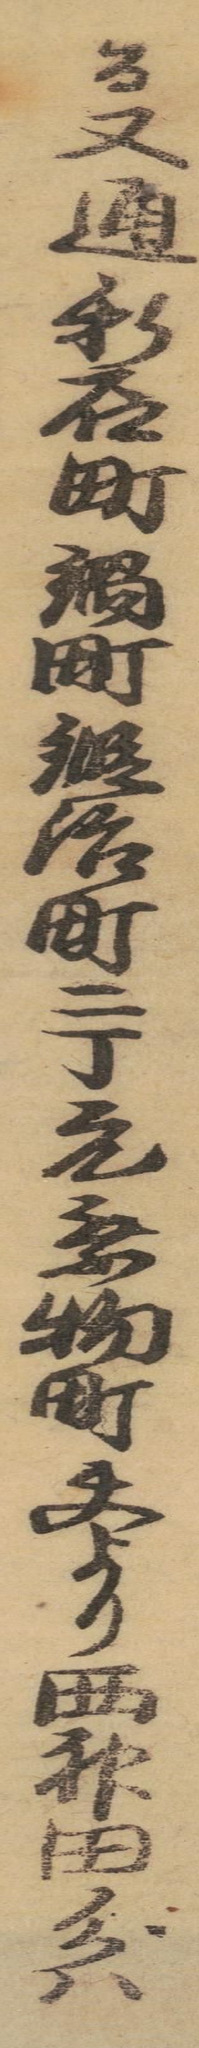る又通新石町鍋町鍛冶町二丁元乗物町夫より西神田分ハ
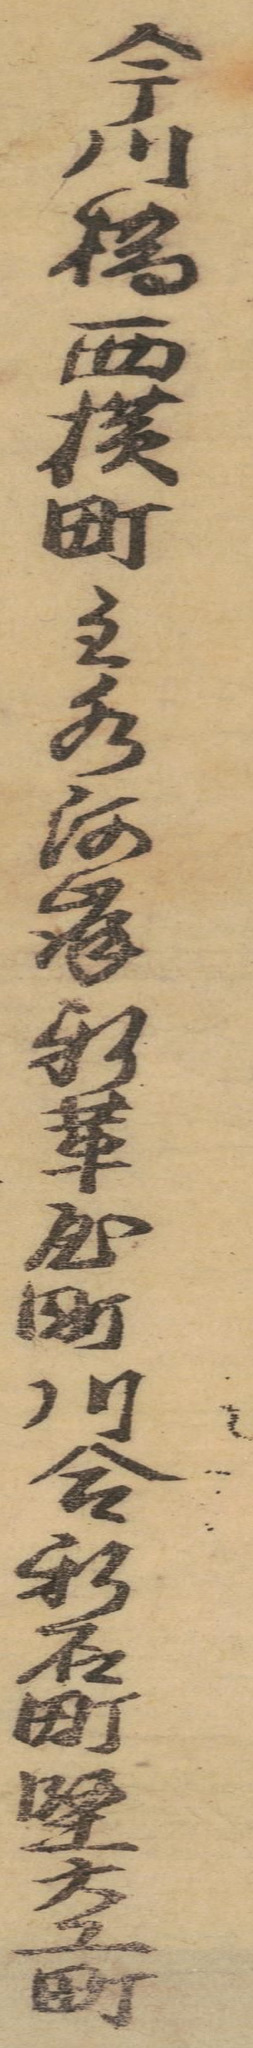今川橋西横町主水河岸新革屋町川合新石町竪大工町
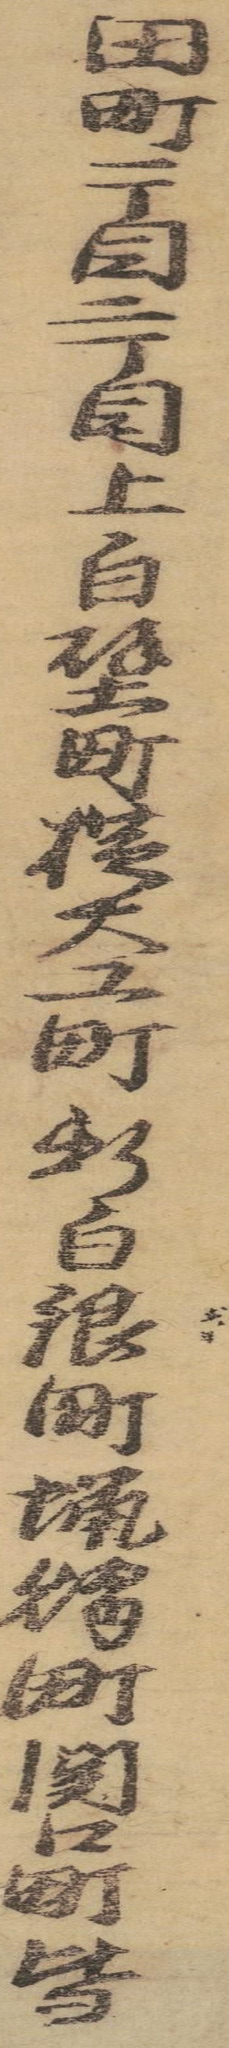田町一丁目二丁目白壁町横大工町新白金町蝋燭町関口町皆
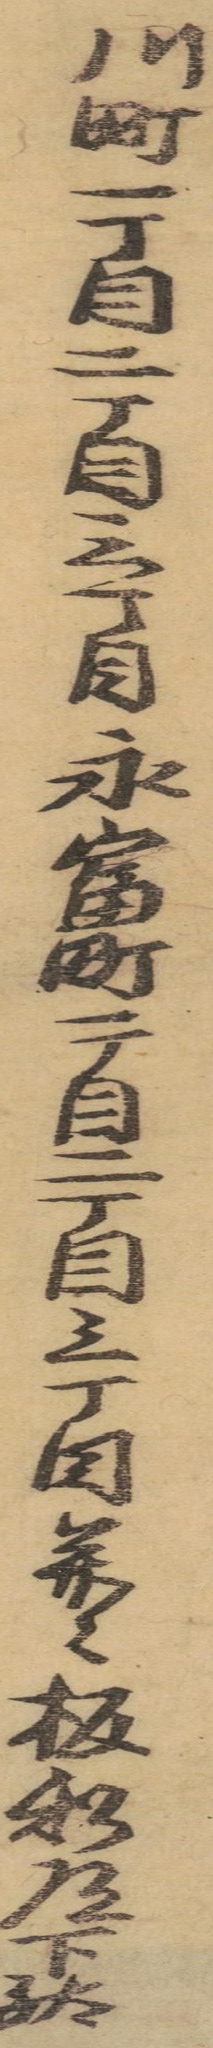川町一丁目二丁目三丁目永福町一丁目二丁目三丁目幷ニ板新道下駄
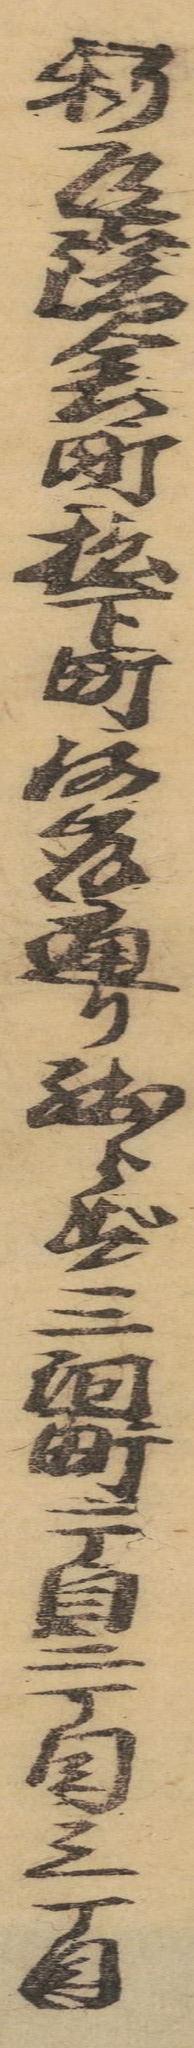新道鎌倉町松下町河岸通り残らず三河町一丁目二丁目三丁目
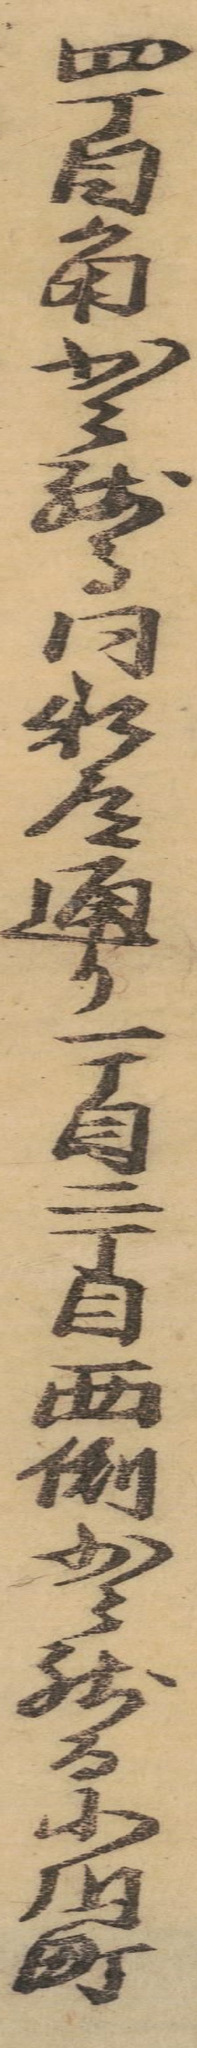四丁目角少々残る同新道通り一丁目二丁目西側少々残る小川町
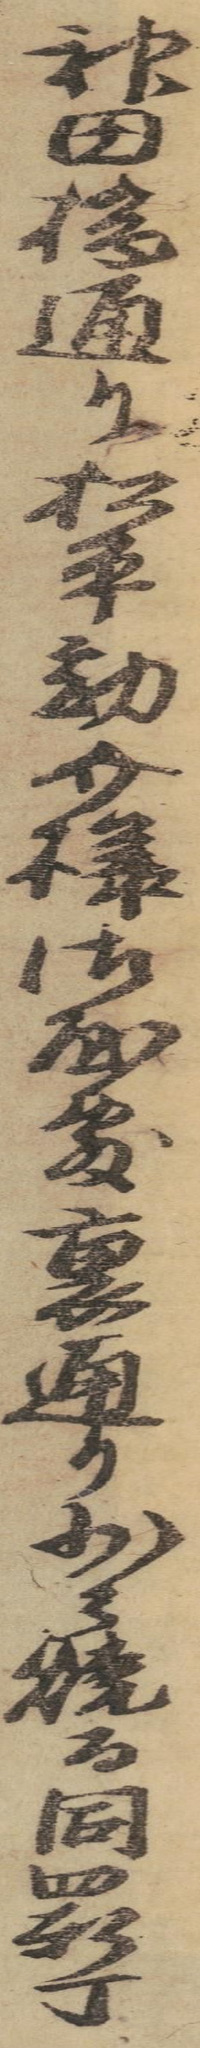神田橋通り松平勘介様御屋敷浦裏通り少々焼る同四軒丁
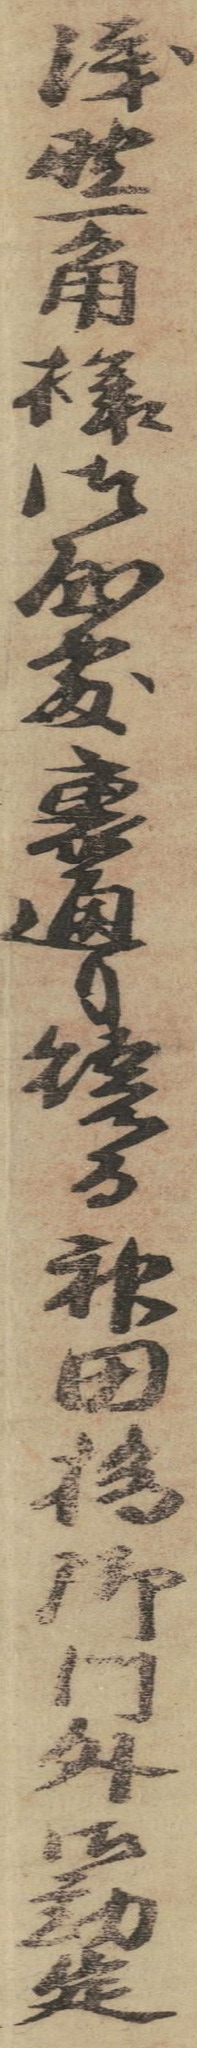浅野一角様御屋敷裏通り焼る神田橋御門外御勘定
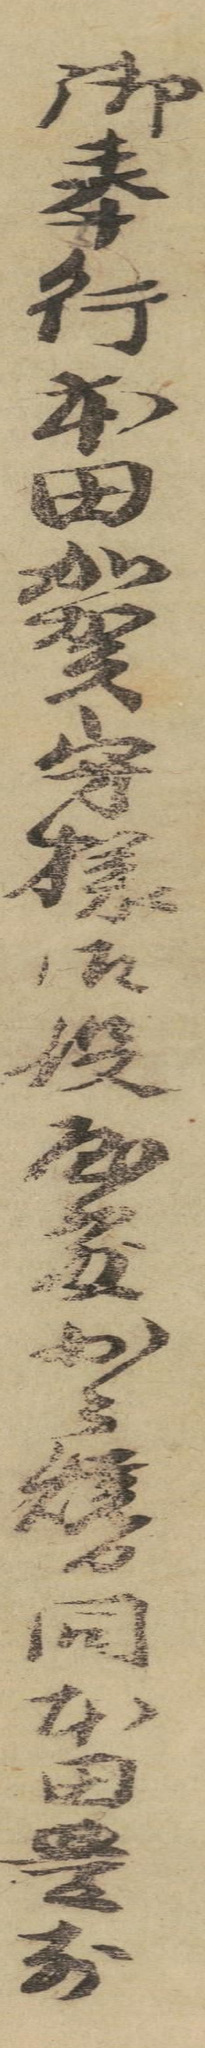御奉行本多加賀守様御役屋敷少々焼る同本多豊前
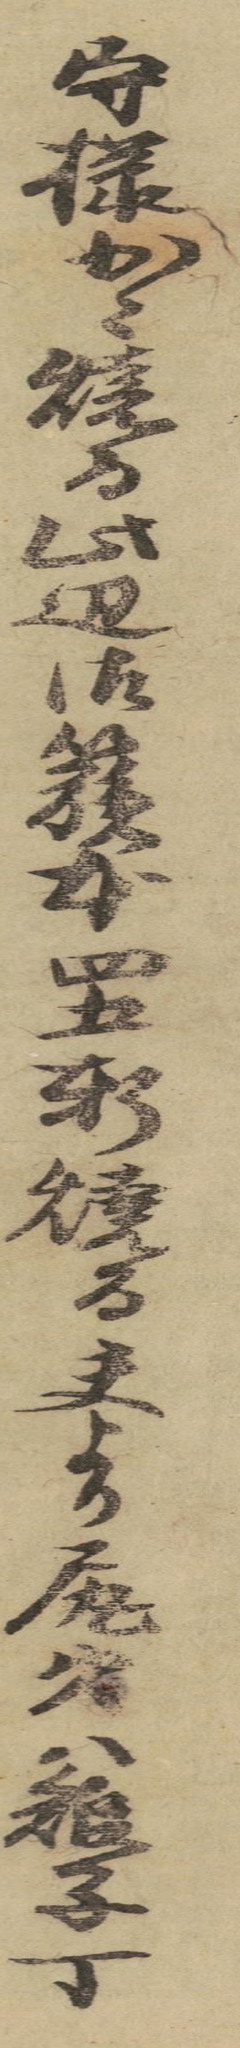守様少々焼る此辺御旗本四五軒焼る夫より尻火ハ雉子丁
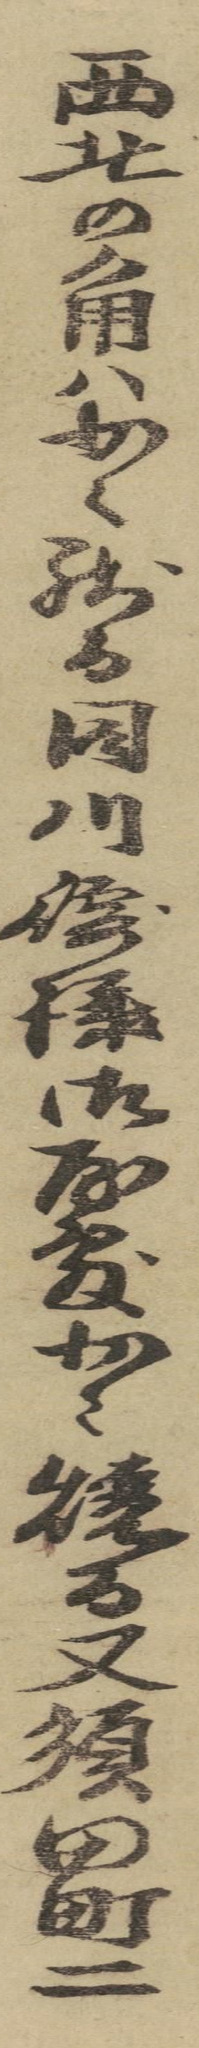西北の角ハ少々残る同川崎様御屋敷少々焼る又須田町二
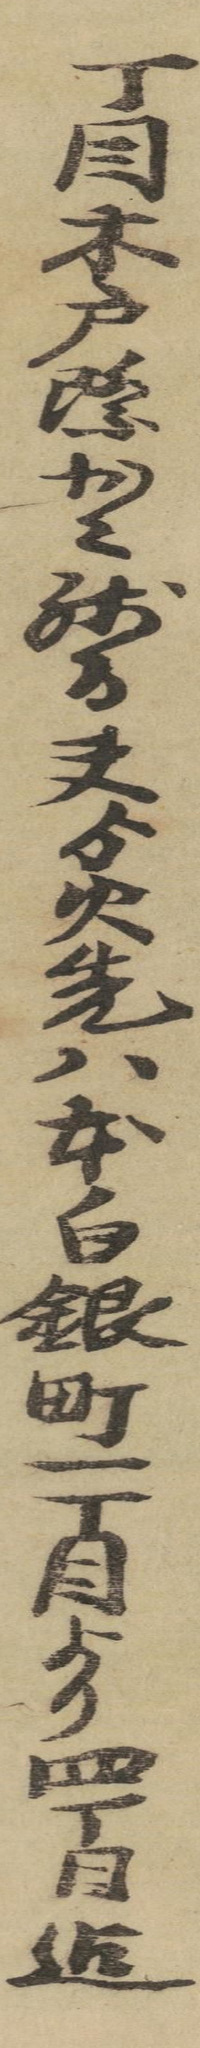丁目木戸際少々残る夫より火先ハ本白金町一丁目より四丁目迄
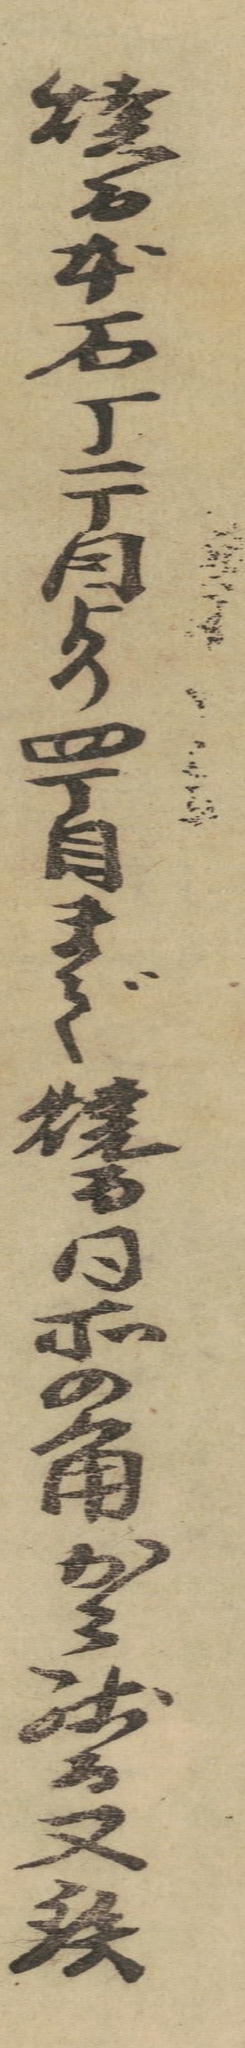焼る本石丁一丁目より四丁目まで焼る同所の角少々残る又鉄
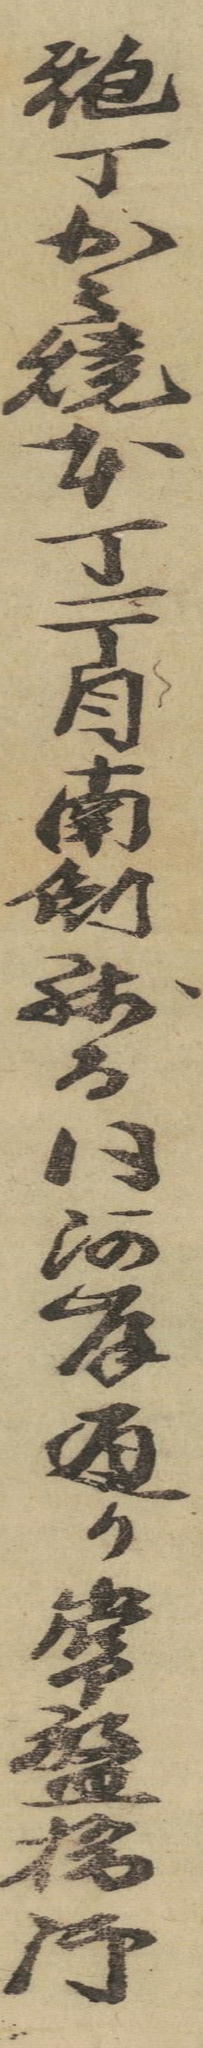炮丁少々焼本丁一丁目南側残る同河岸通り常盤橋御
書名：[安政元年十二月の江戸大火に関する瓦版]
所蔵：東京大学地震研究所図書室 Earthquake Research Institute Library, The University of Tokyo, JAPAN
